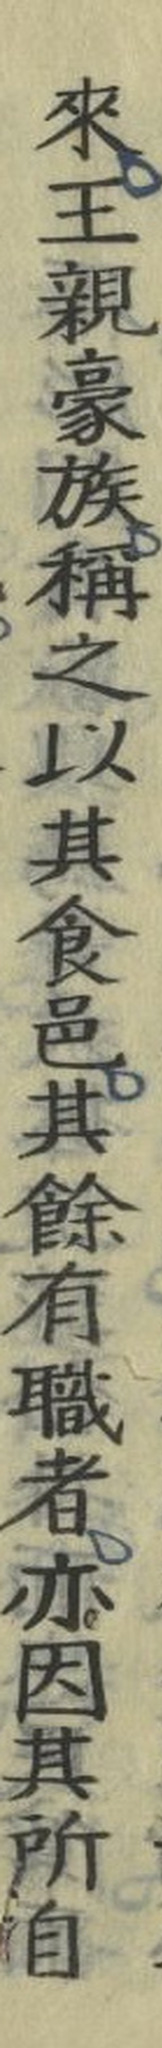來。王親豪族。稱之以其食邑。其餘有職者。亦因其所自
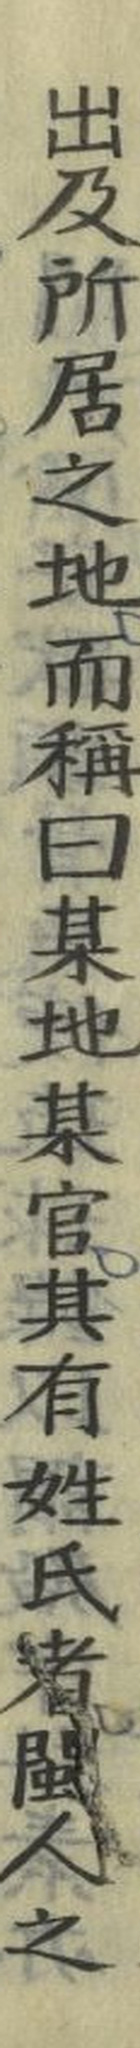出及所居之地。而稱曰某地某官。其有姓氏者。閩人之
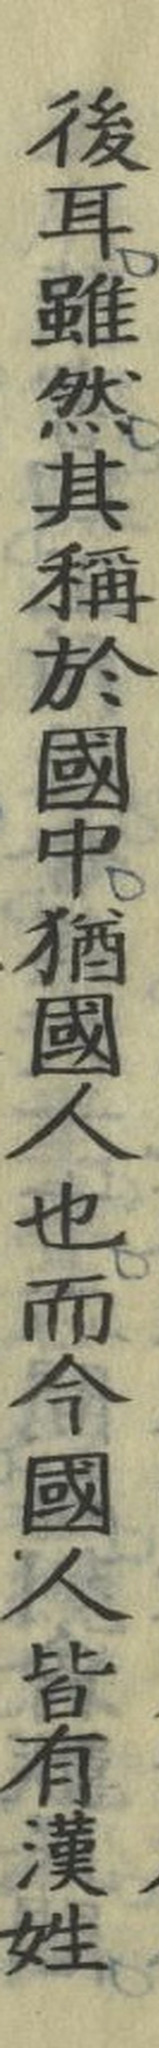後耳。雖然。其稱於國中。猶國人也。而今國人皆有漢姓

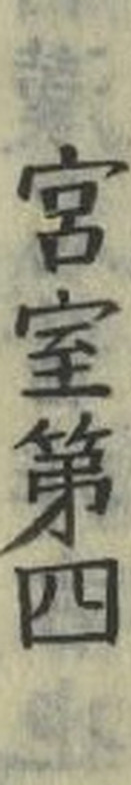宮室第四
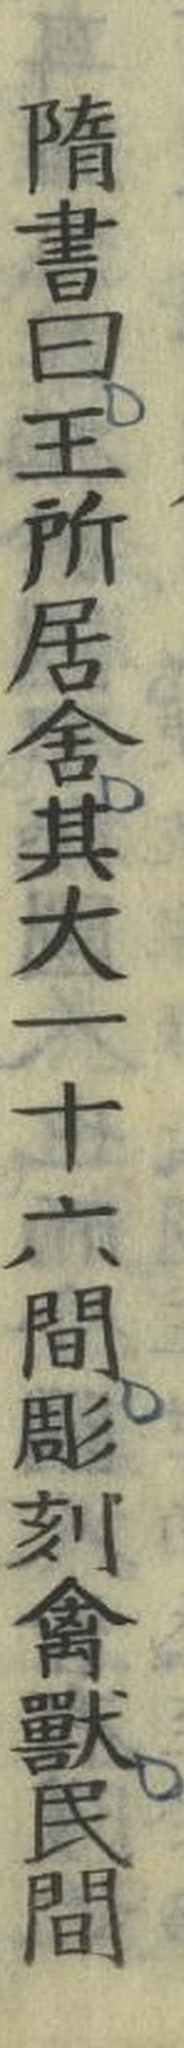隋書曰。王所居舎。其大一十六間。彫刻禽獸。民間
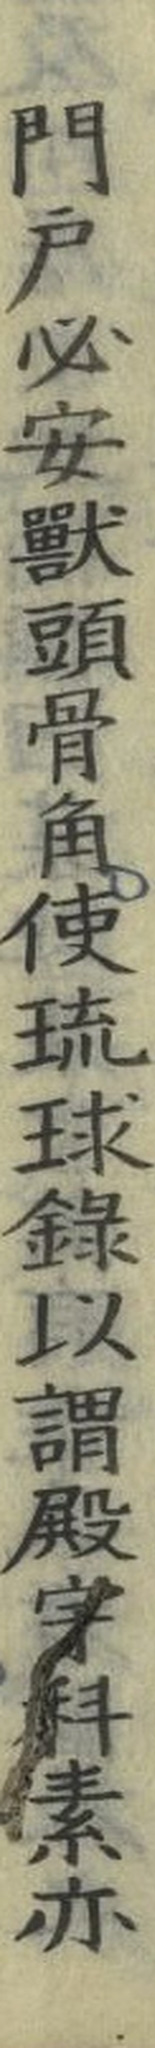門戸必安獸頭骨角。使琉球錄以謂殿宇科素亦
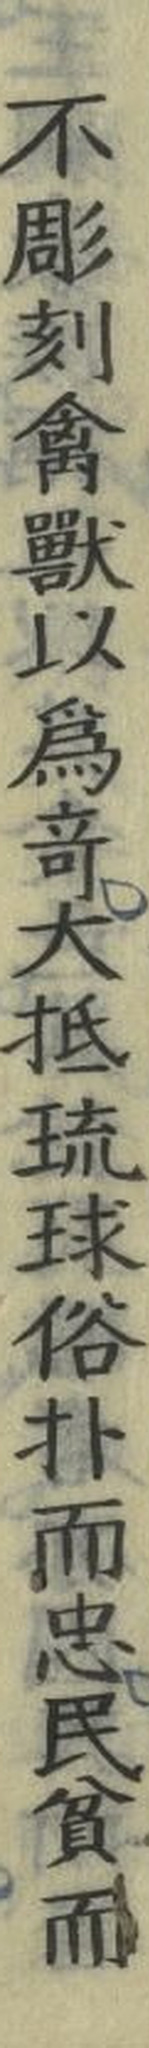不彫刻禽獸以爲竒。大抵琉球俗扑而忠。民貧而
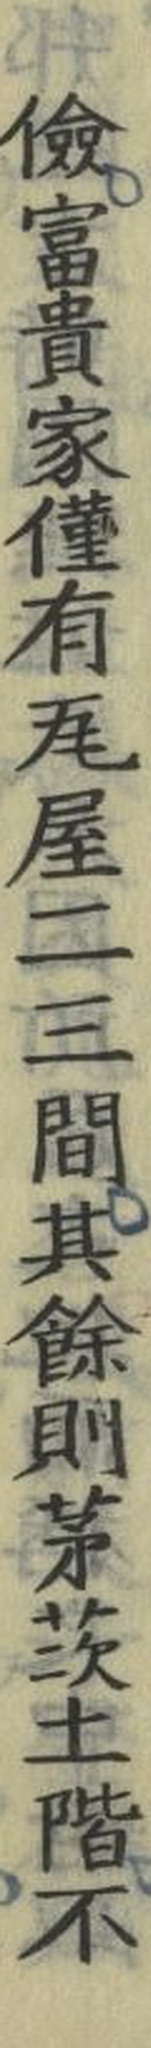儉。富貴家僅有瓦屋二三間。其餘則茅茨土階。不
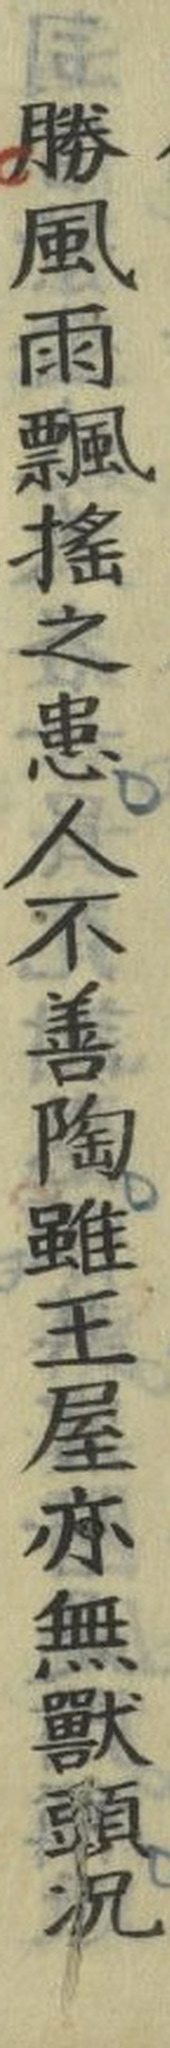勝風雨飄搖之患。人不善陶。雖王屋亦無獸頭。况
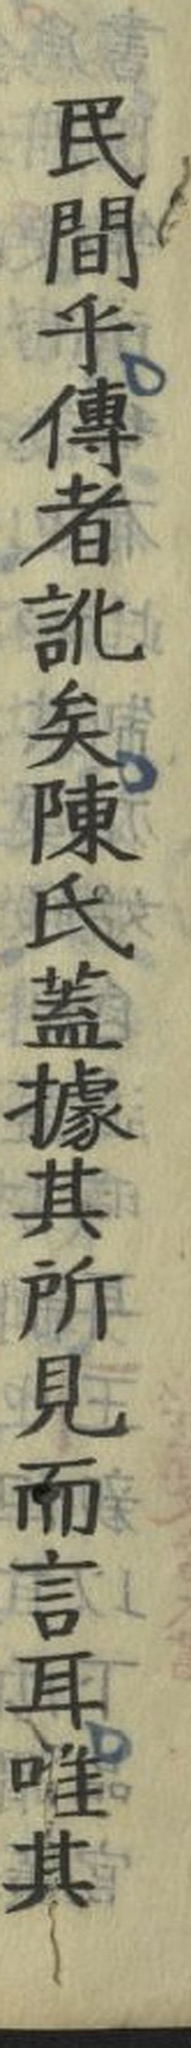民閒乎。傳者訛矣。陳氏蓋據其所見而言耳。唯其
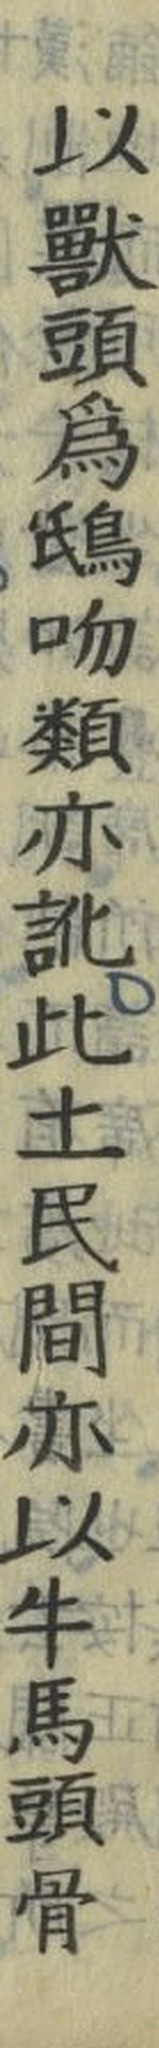以獸頭爲鴟吻類亦訛。此土民間亦以牛馬頭骨
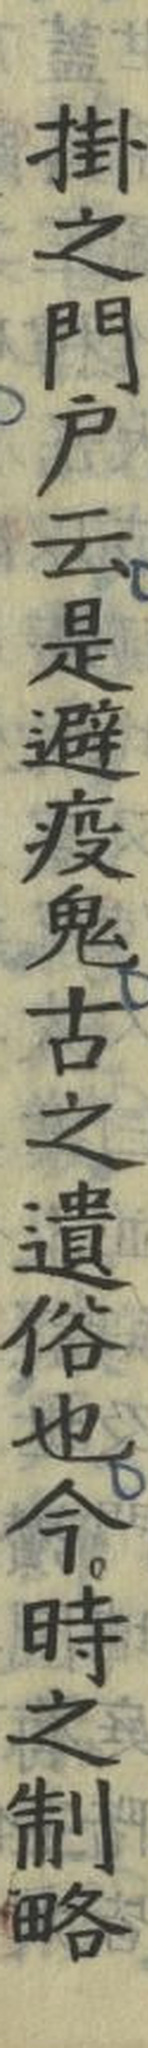掛之門戸云。是避疫鬼。古之遺俗也。今時之制略
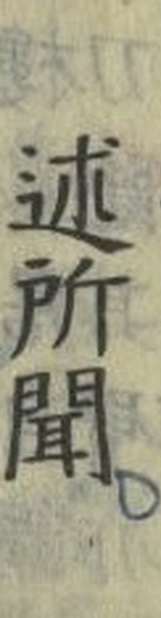述所聞。
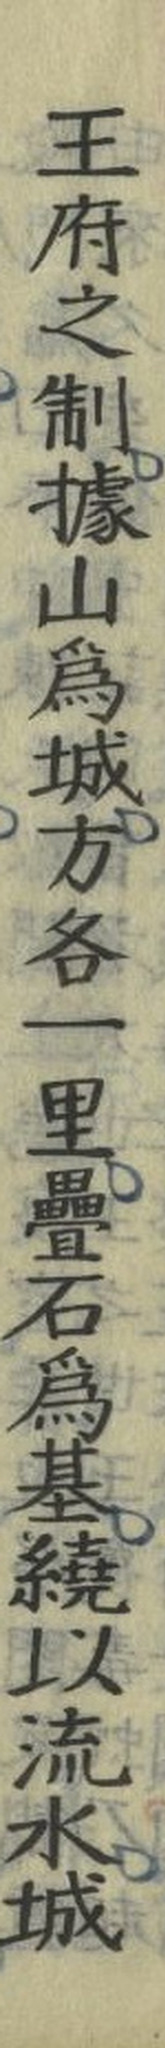王府之制。據山爲城。方各一里。疊石爲基。繞以流水。城
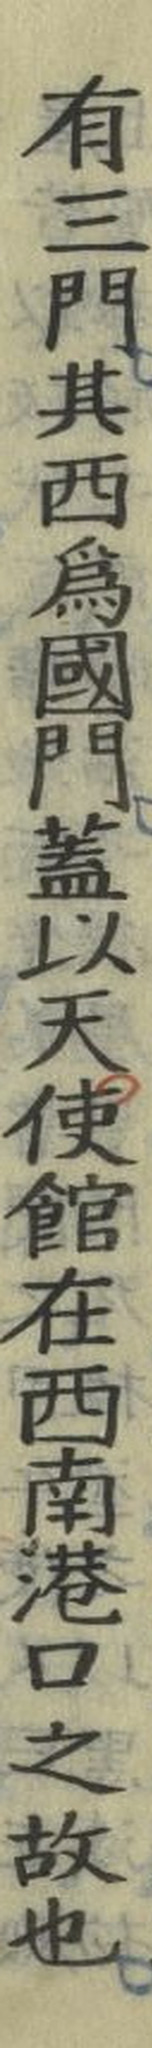有三門。其西爲國門。蓋以天使館在西南港口之故也
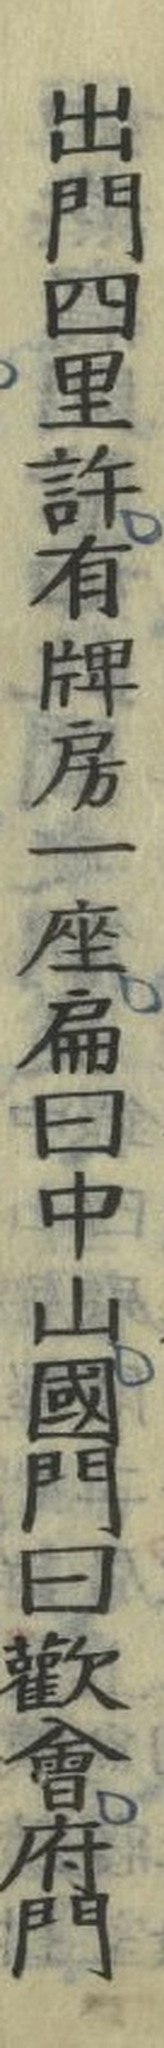出門四里許。有牌房一座。扁曰中山。國門曰歡會。府門
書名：南島志
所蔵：University of the Ryukyus Library
